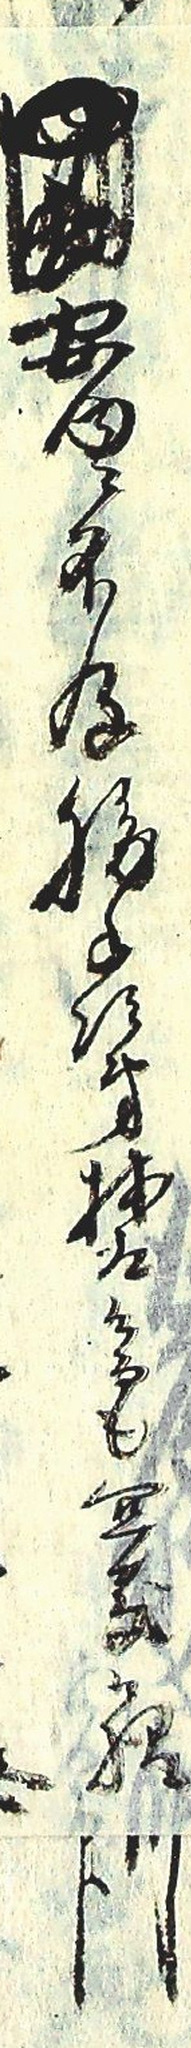安内に不及勝手次第材取候ても宜敷候様
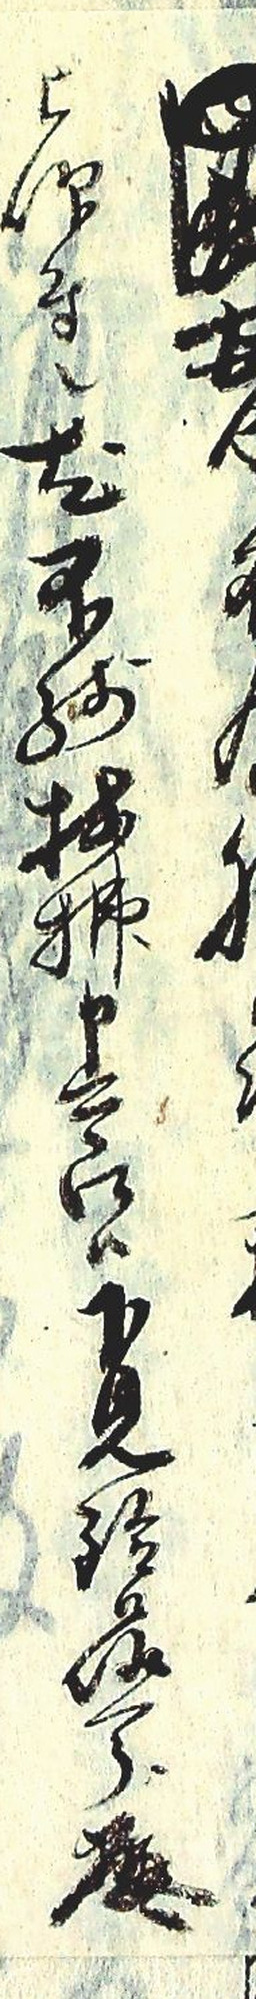被仰付候尤不残材払申節は下見鈴口儀一郎殿へ
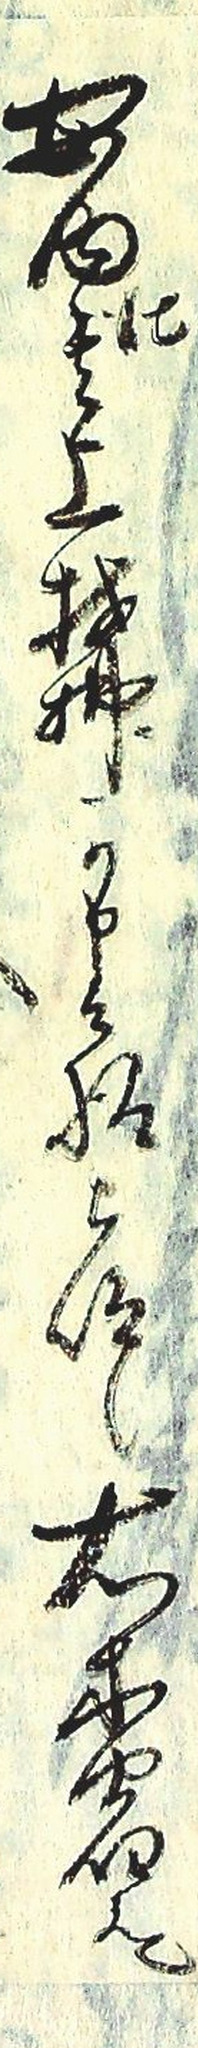安内仕其上材払可申候様被仰候右木宿を
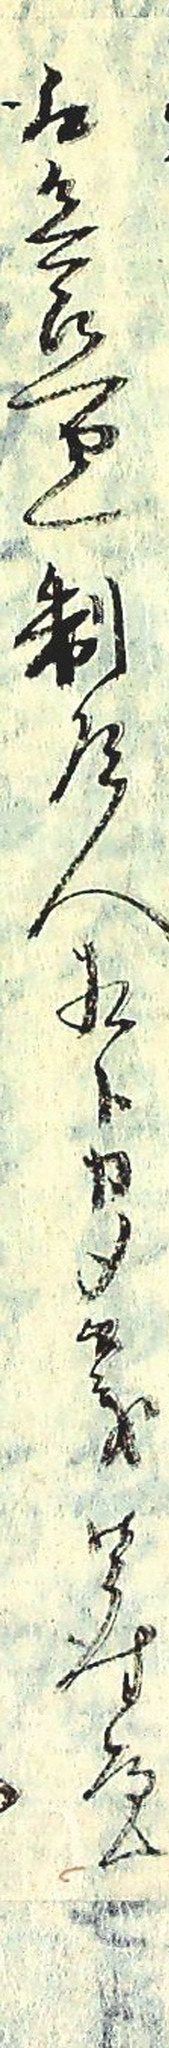取候節万一制道人相とかめ候義御座候得は
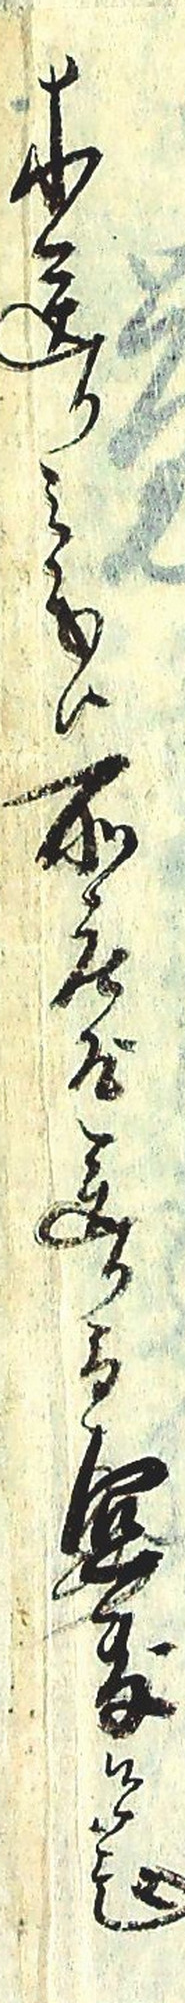木送り之義は所庄屋送りにて宜敷候御趣
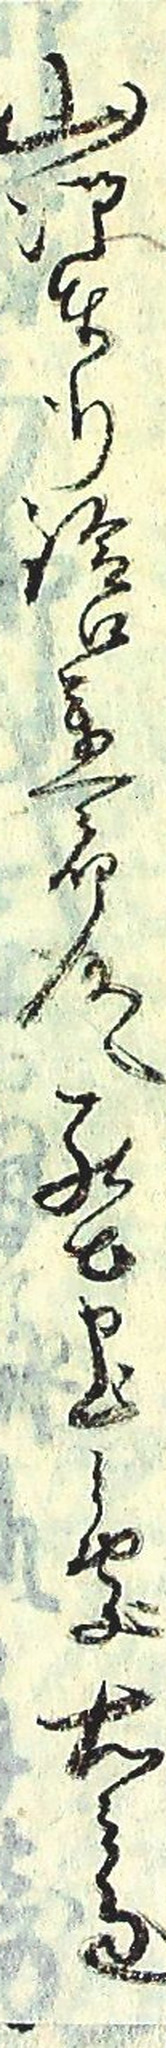山御奉行鈴口義一郎殿へ罷出申上候処右之通
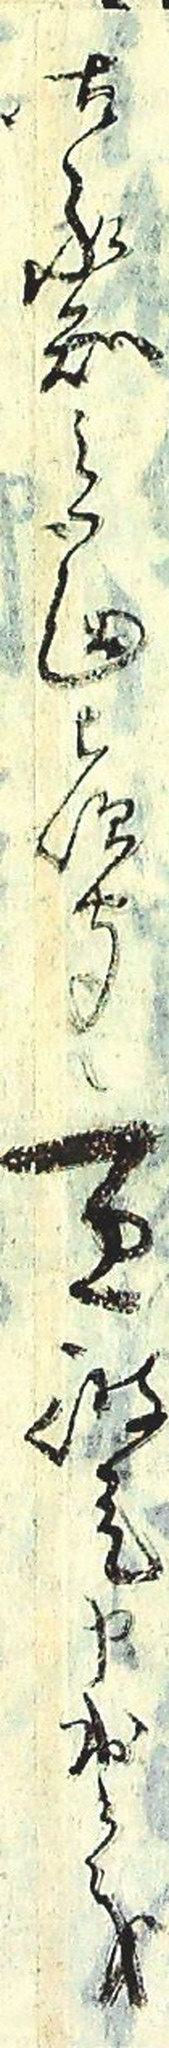御承知之御趣被仰聞候万一彼是申出候義
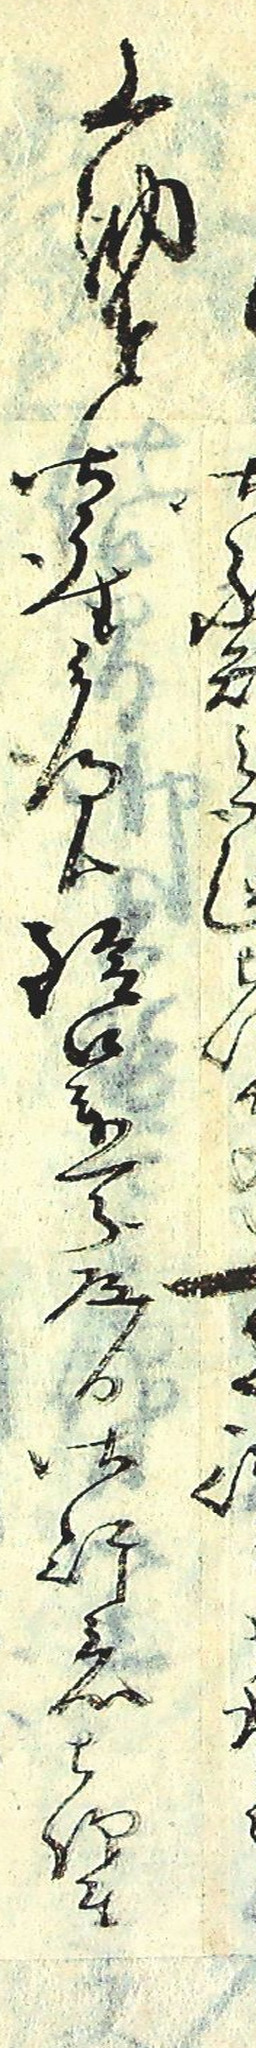御座候得は鈴口義一郎殿ゟ御行着被仰付
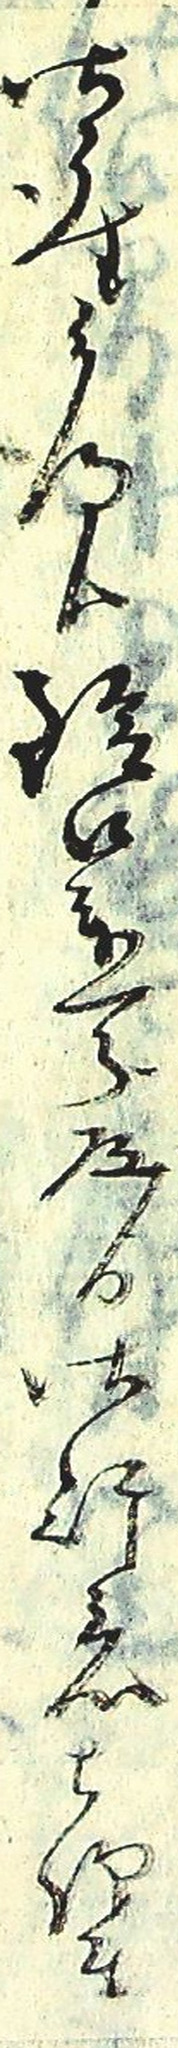御座候得は鈴口義一郎殿ゟ御行着被仰付
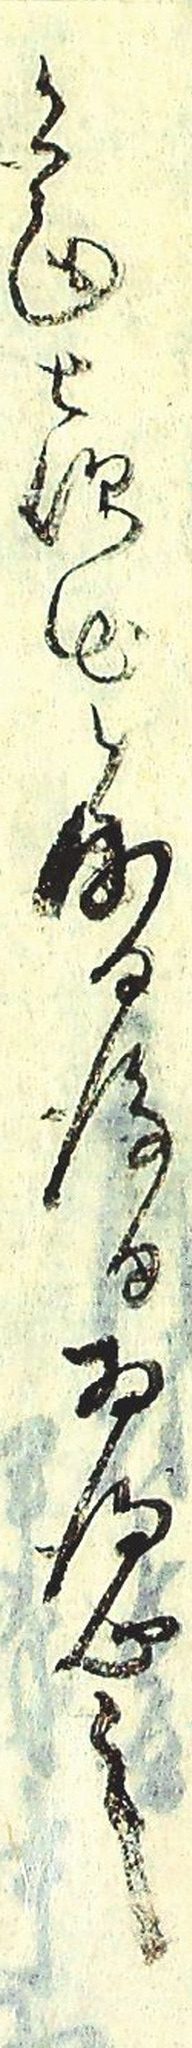候御趣被仰出候仍て後日為得心之
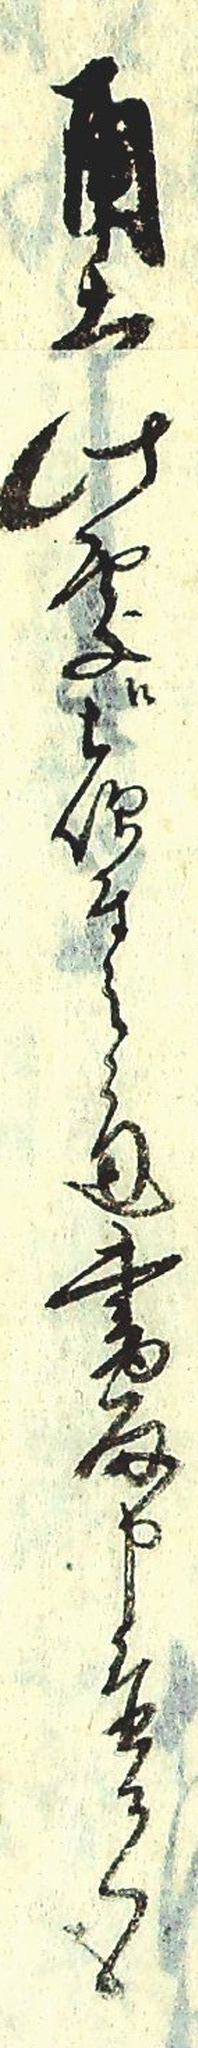此処え被仰付之通書留申置候以上
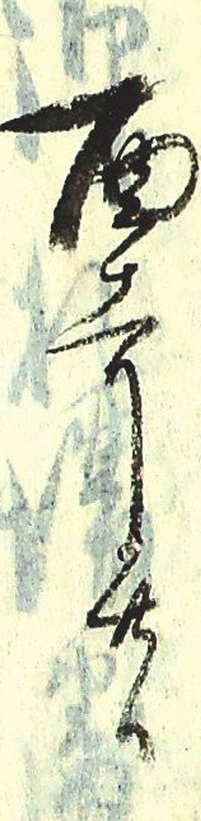酉十一月廿日

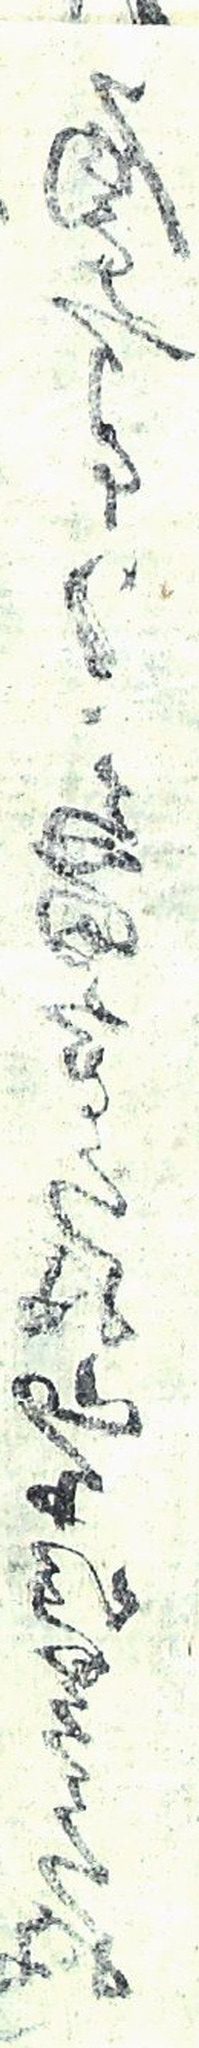酉十一月廿四日
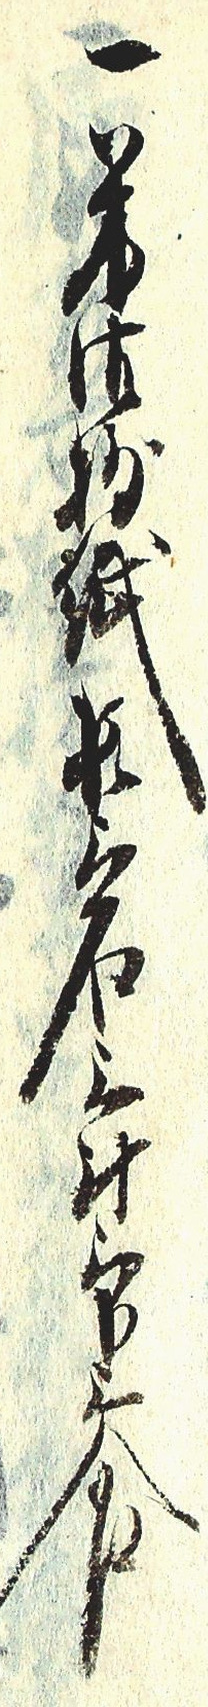一米御指紙拾三石三斗三升三合
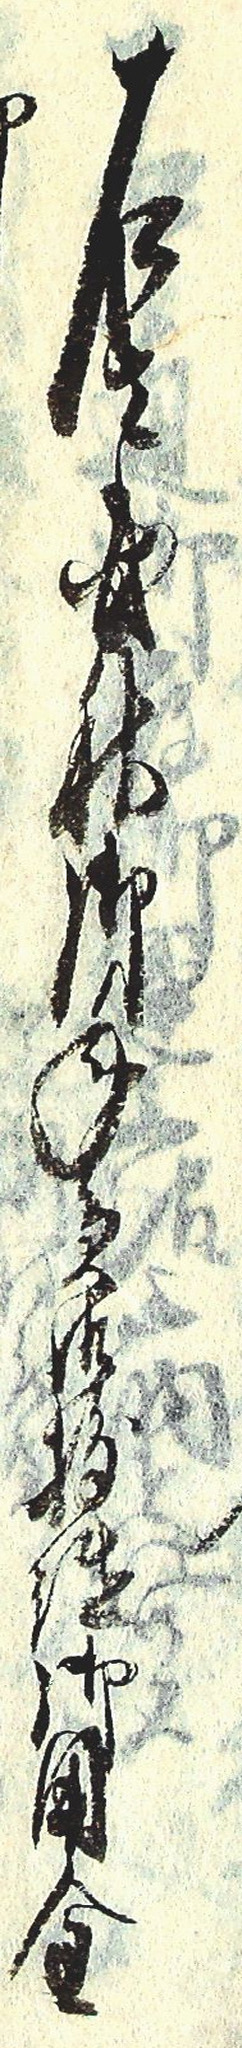右は当秋御年貢御指継御用金
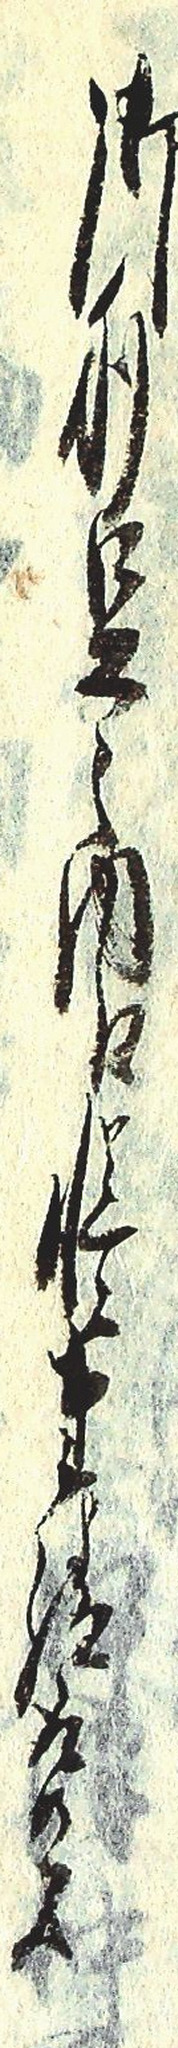御利足之内え慥に奉請取候以上
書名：諸御願書控(弐番）
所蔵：鳴門教育大学 Naruto University of Education
